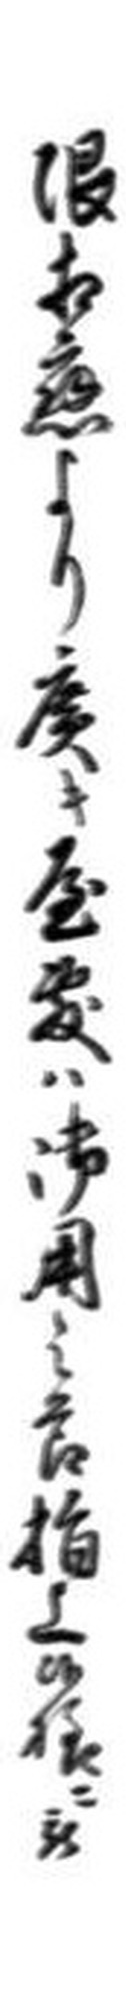限相応より広キ屋敷ハ御用之節指上候様ニ被
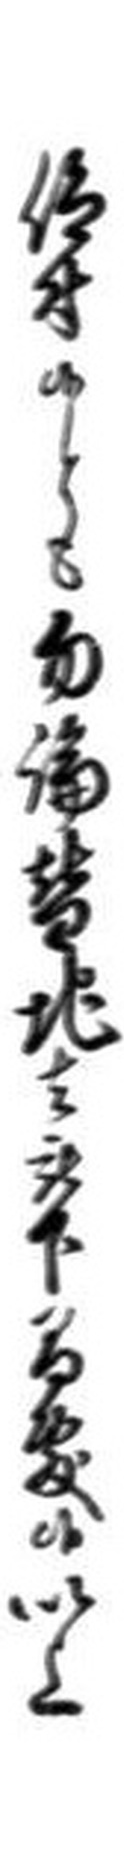仰付候とも勿論替地者被下間敷候以上
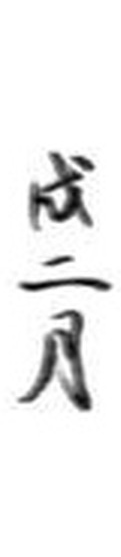戌二月
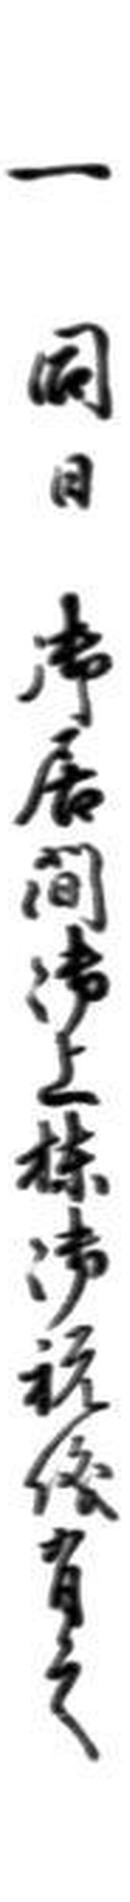一同日御居間御上棟御祝儀有之
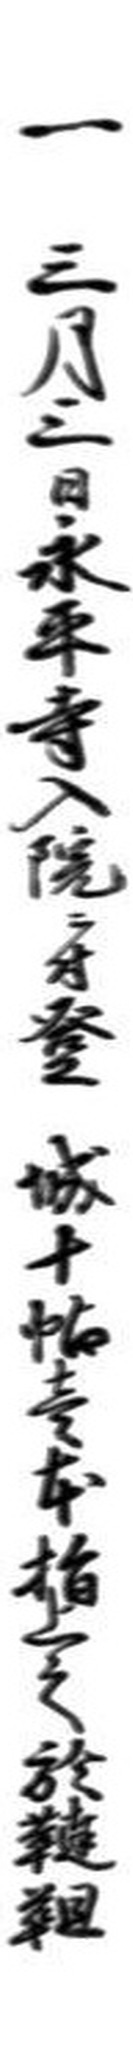一三月三日永平寺入院ニ付登城十帖壱本指上之於韃靼
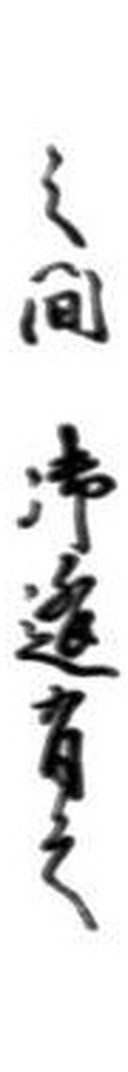之間御逢有之

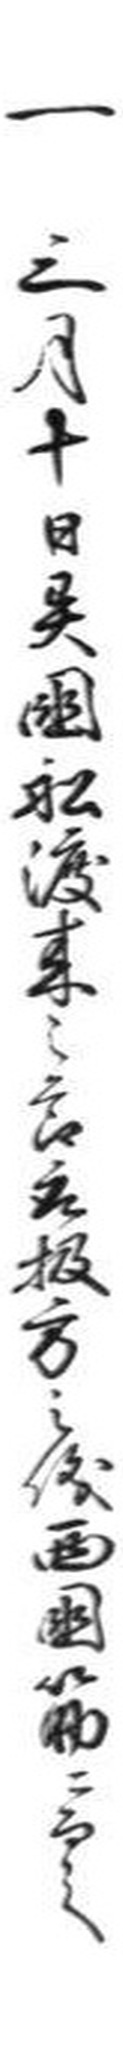一三月十日異国船渡来之節取扱方之儀西国筋ニ而之
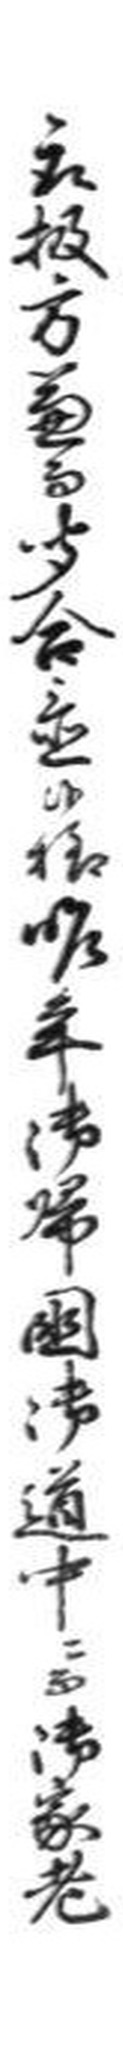取扱方兼而聞合置候様昨年御帰国御道中ニ而御家老
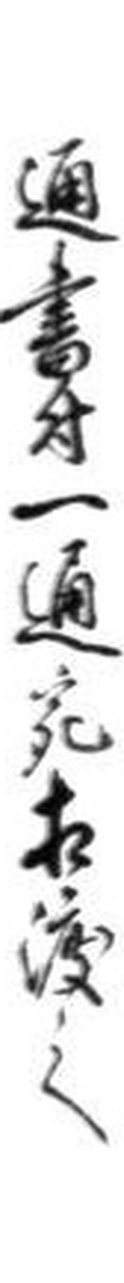通書付一通宛相渡之
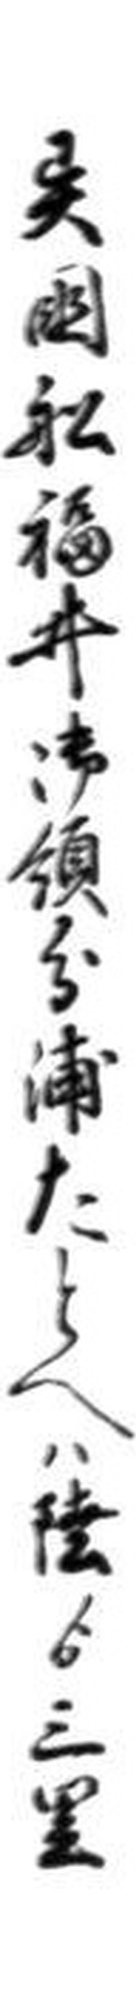異国船福井御領分浦たとへハ陸ゟ三里
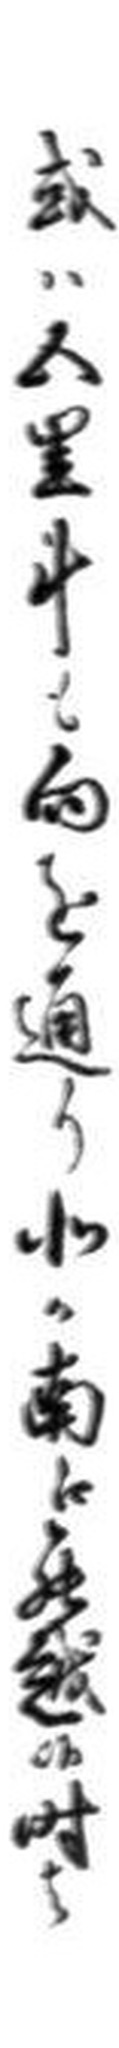或ハ五里斗も向を通り北か南江罷越候時者
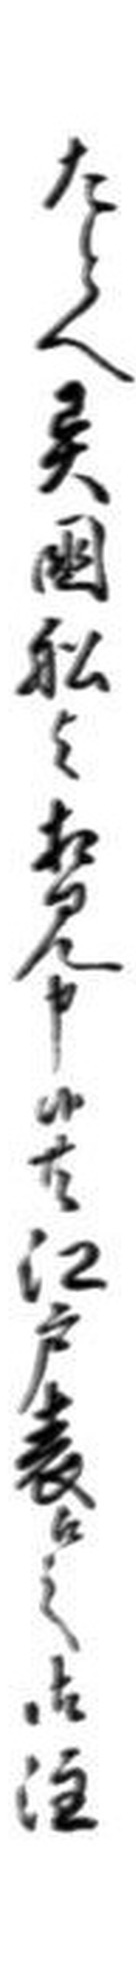たとへ異国船与相見申候共江戸表江之御注
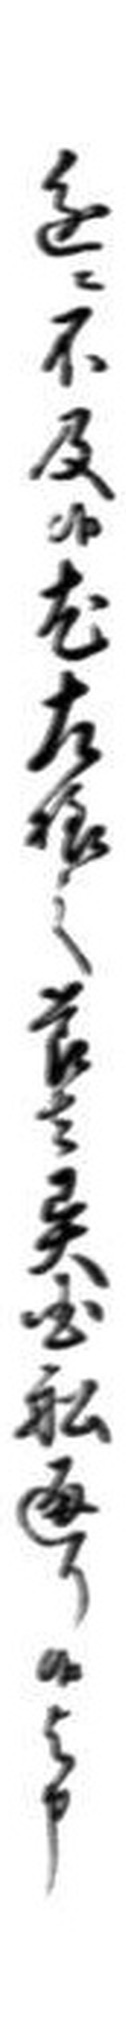進ニ不及候尤左様之節者異国船通り候与申
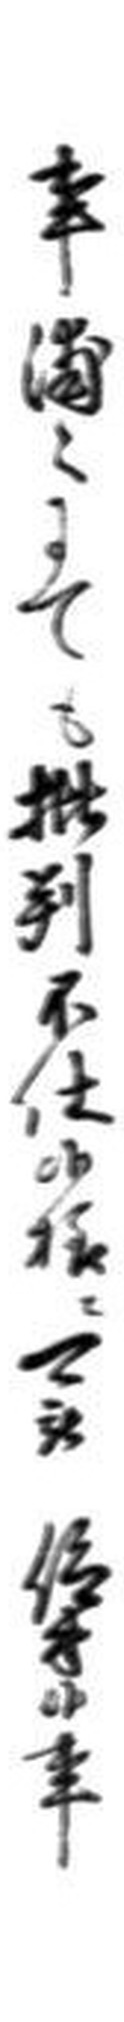事浦々にても批判不仕候様ニ可被仰付候事
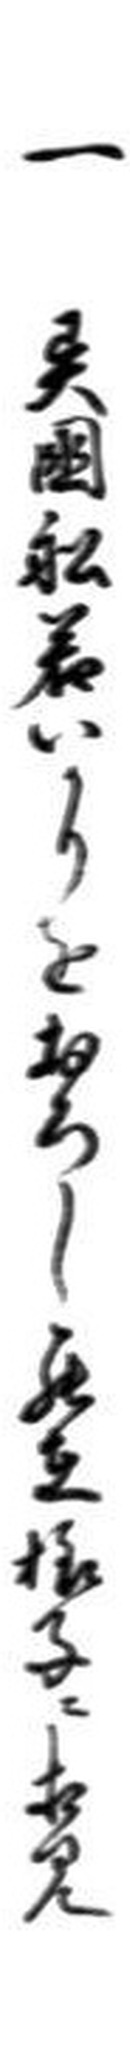一異国船若いかりをおろし罷在様子ニ相見
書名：家譜 三十二 吉邦公 従享保二年到享保三年
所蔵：福井県文書館 Fukui Prefectural Archives
